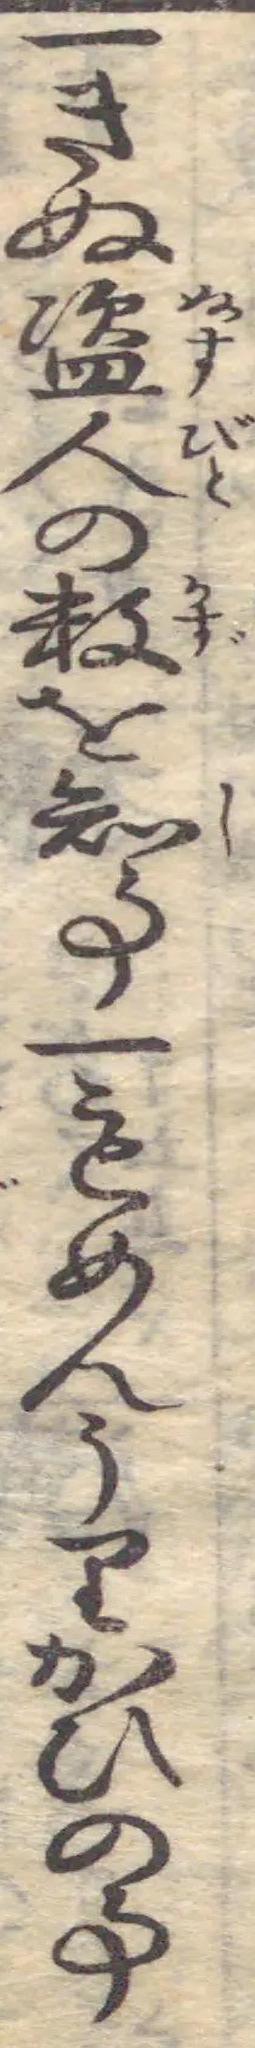一きぬ盗人の数を知事一もめんうりかひの事
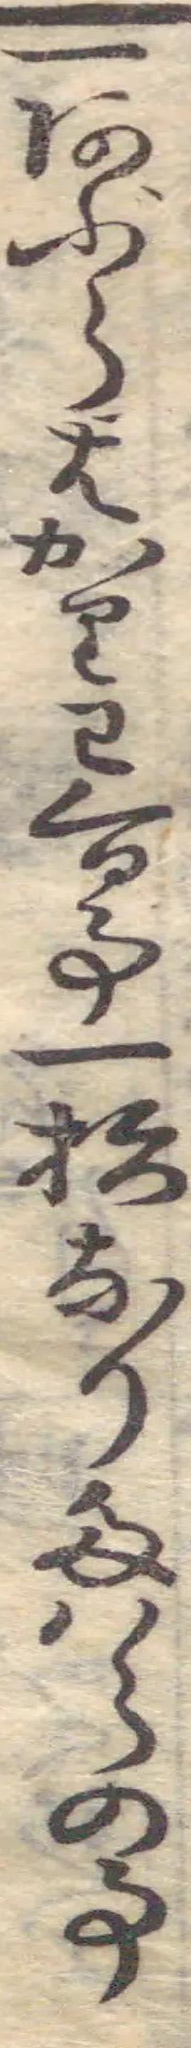一あぶらはかりわくる事一杉なりたはらの事
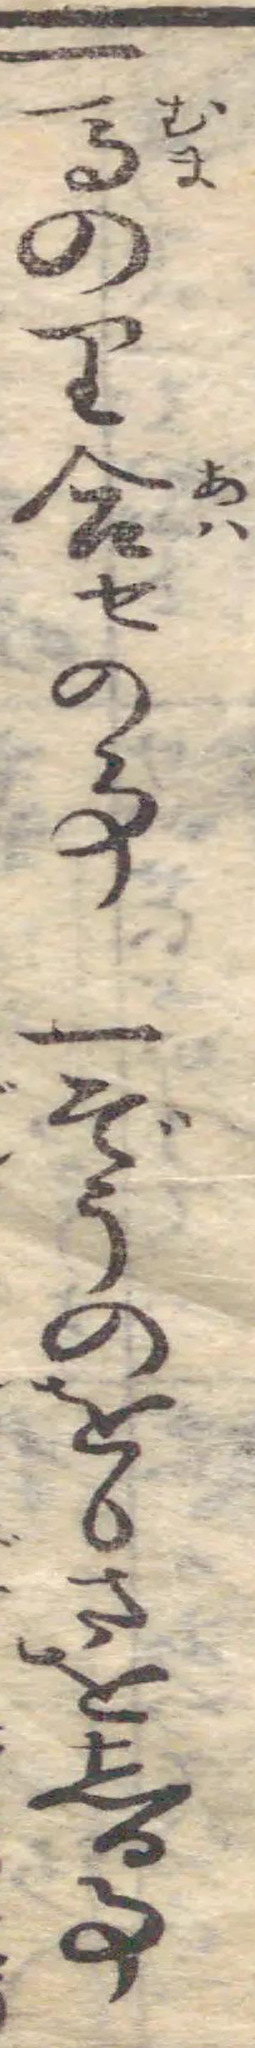一馬のり合せの事一ぞうのをもさをしる事
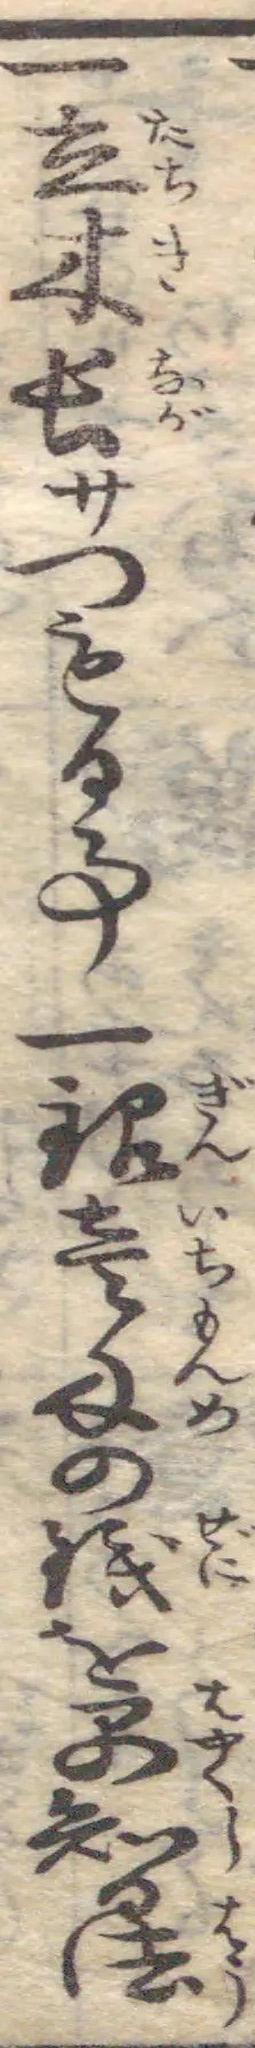一立木長さつもる事一銀壱匁の銭を早知る法
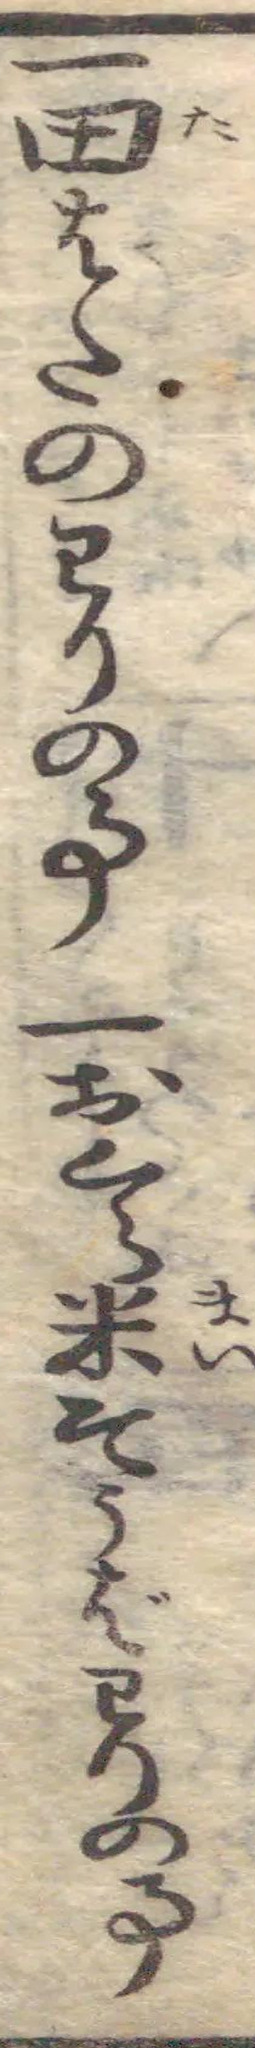一田ばたのわりの事一おくら米そうばわりの事

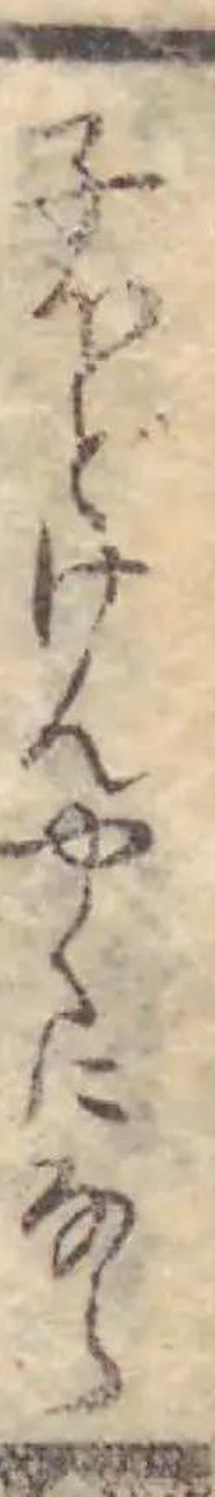子ほどけんやくになら
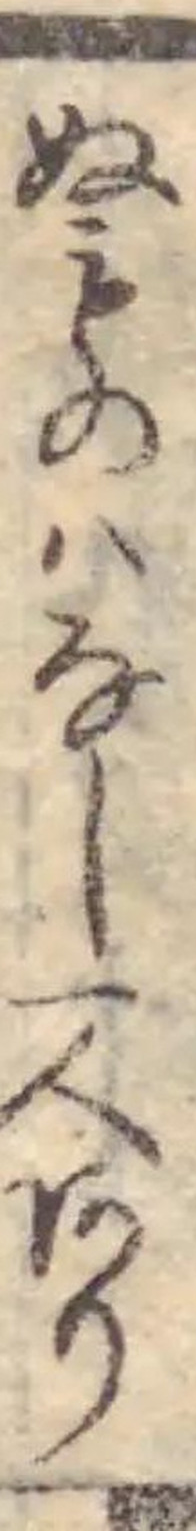ぬものはなし一人あり
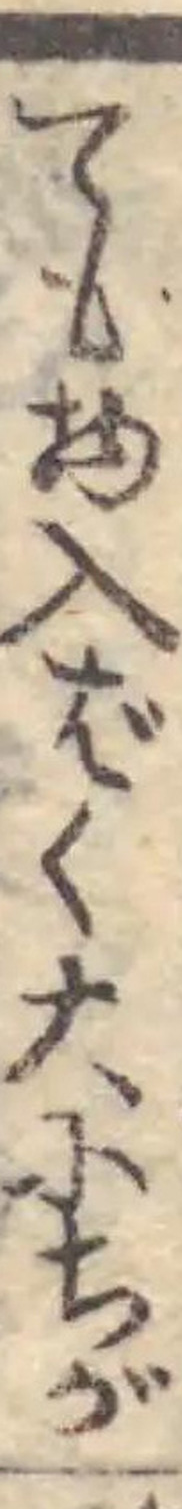ても物入ばく大にちが
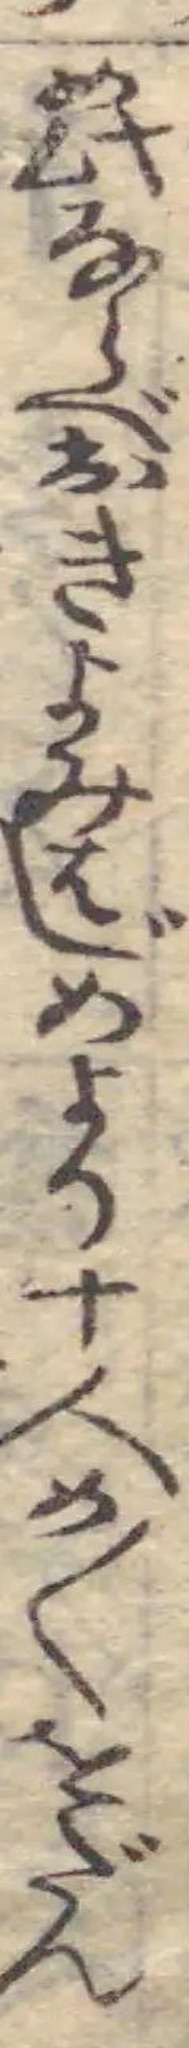如此ならべおきよみはじめより十人め〳〵をだん
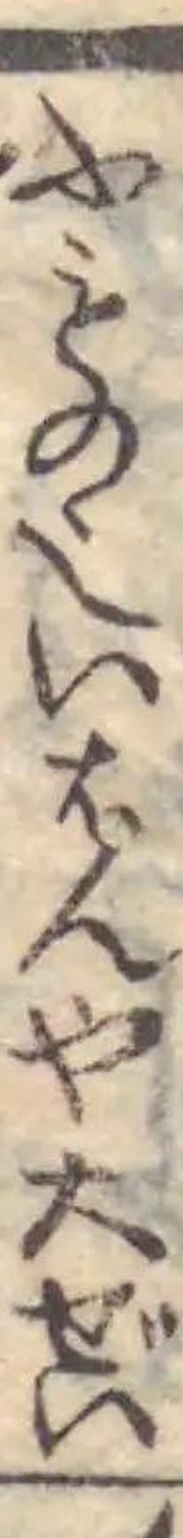ふもの也いはんや大ぜい
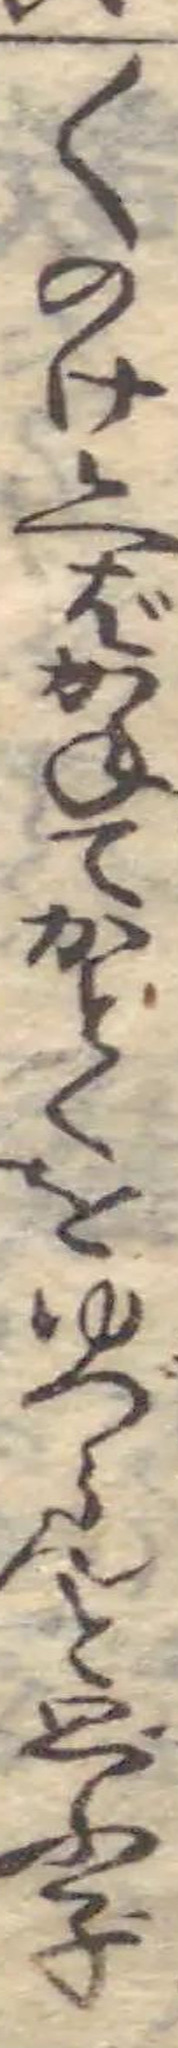〳〵のけ候へばかねてかとくをゆづらんと思ふ子
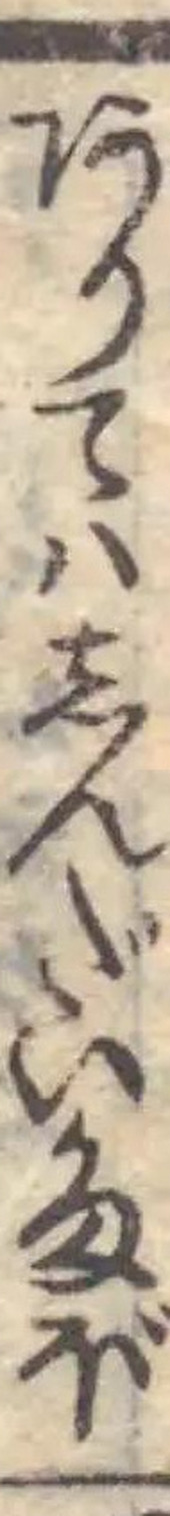ありてはしんだいかまぼ
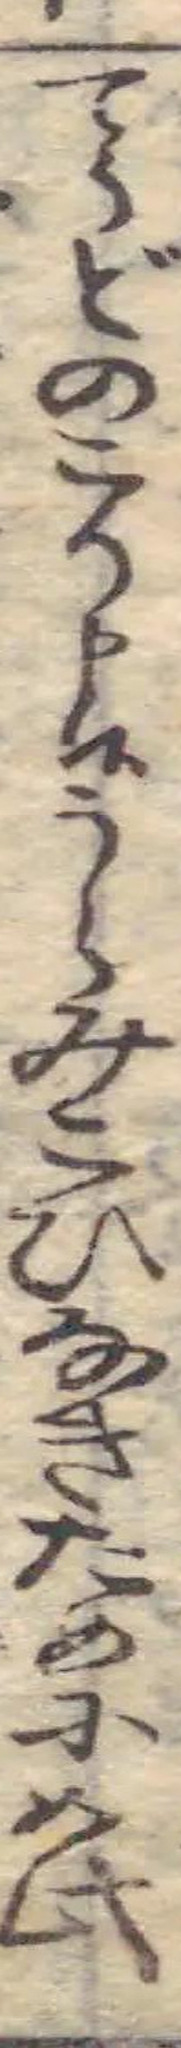てうどのこり申候うらみこひなきために如此
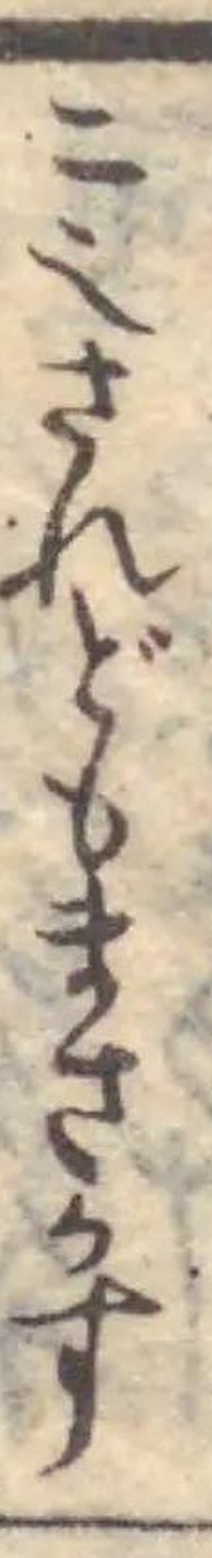こ也されどもまさかす
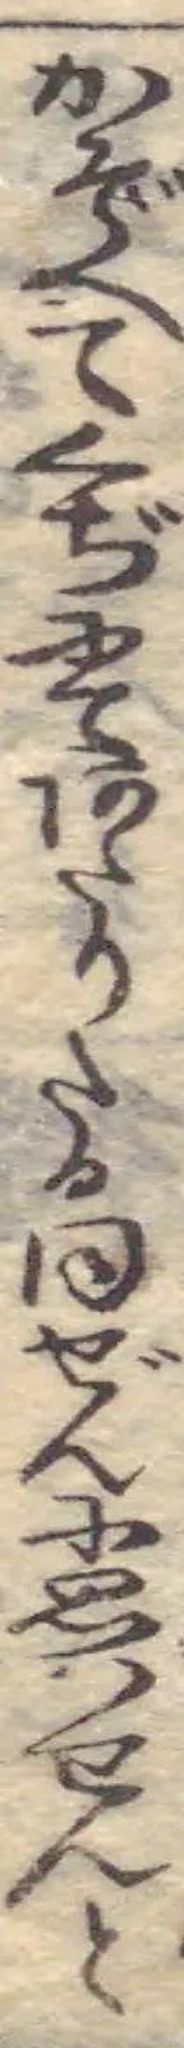かぞへてくぢにてあたりたる同ぜんに思はせんと
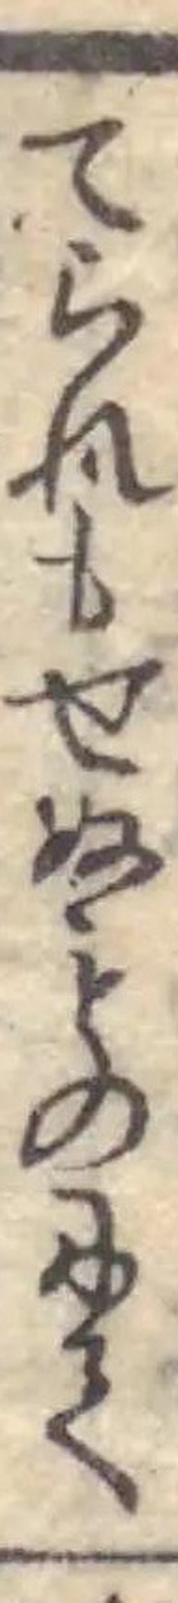てられもせぬものにて
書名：大通人好記
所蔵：国立国会図書館 National Diet Library, JAPAN
